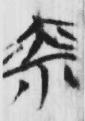○（夕）
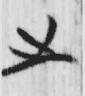之
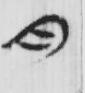月
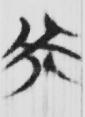癸
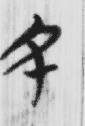丑
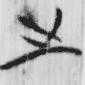之
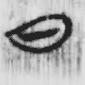日
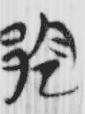陰
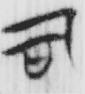司
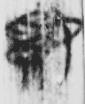敗
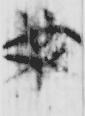某
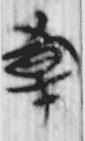倝
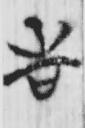告
